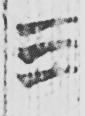三
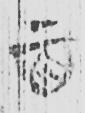百
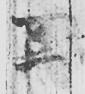五
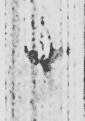十
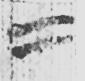二
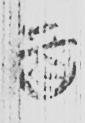百
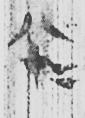八十=
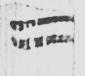二
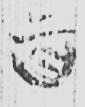百
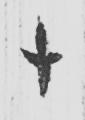十
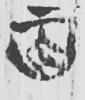百
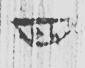四
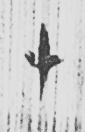十
